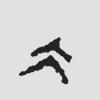大
